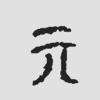亓（其）
